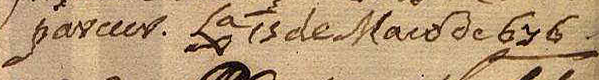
parecer. Lxa 15 de Maio de 676
